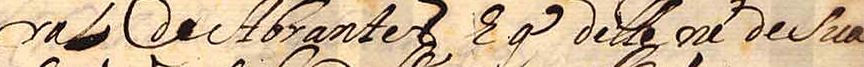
ral de Abrantes E q̄ delle nē de sua
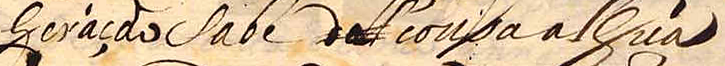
geração sabe dell cousa alguā.
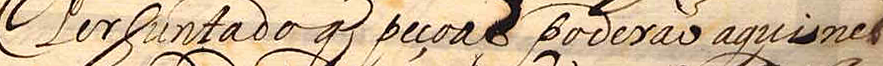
Perguntado q̄ peçoas poderaõ aqui nes
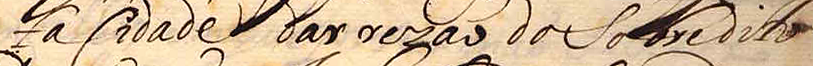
ta Cidade dar rezaõ do sobredito
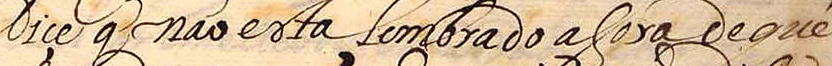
Dice q̄ naõ esta Lembrado agora de quē
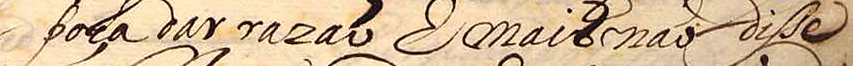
poça dar razaõ E mais naõ disse
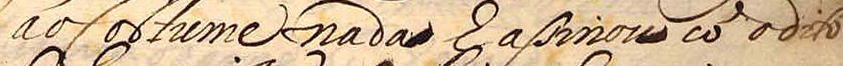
ao Costume nada E assinou cō o dito
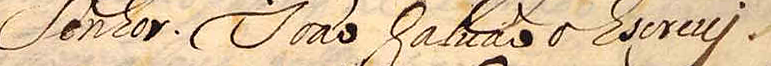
senhor Ioão Galuão o Escreuj.
